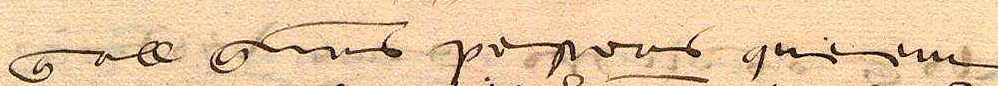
q̄ allguas pessoas que em
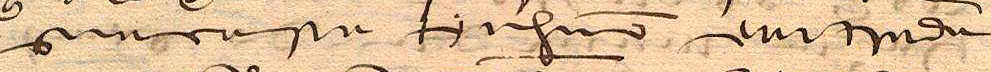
sua cassa tynhão emtrada
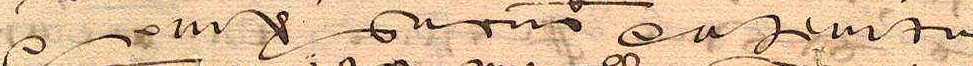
e comꝟsaçaõ e atenta
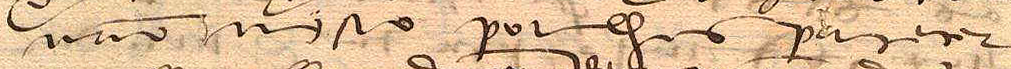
uão nysso por lhes parecer
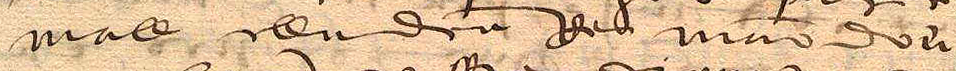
mall ella dc̄a Re mãodou
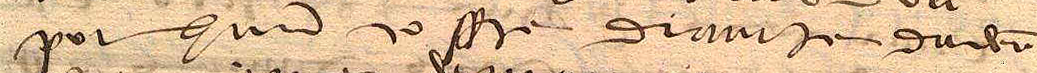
por huū coffre diamte da dc̄a
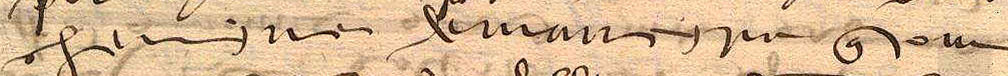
chemyne de maneyra q̄ com
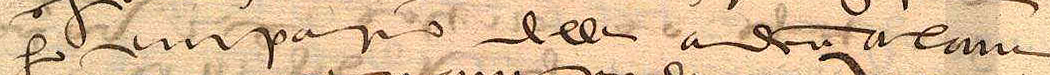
ho emparro delle a dc̄a alam
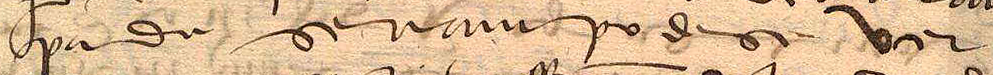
pada se nam podese ver
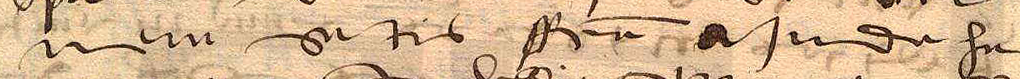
nem satisffc̄a aJnda ha
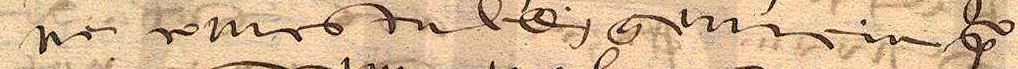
rre com esta dellygemcia p̄o
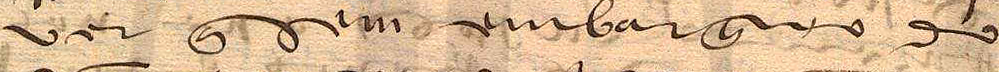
ver q̄ sem embargo do
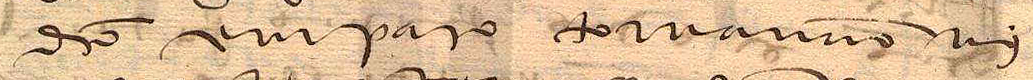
dc̄o emparo tornauão ny
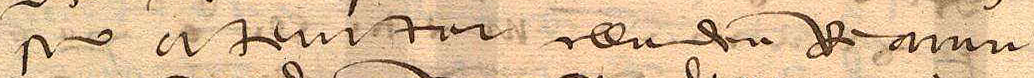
sso atemtar ella dc̄a Re a mu
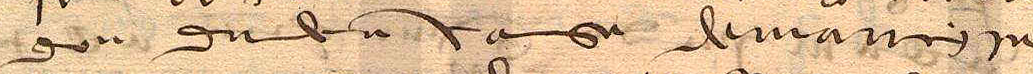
dou da dcā casa de maneyra
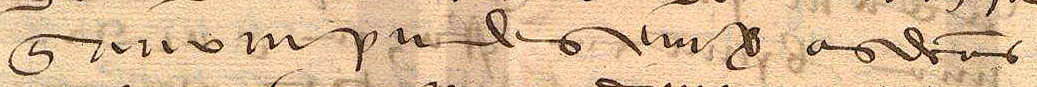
q̄ a nom pudesem ꝟ as dc̄as
